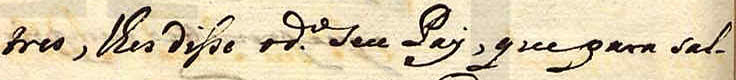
tres, lhes disse o d.o seu Pay, que para sal
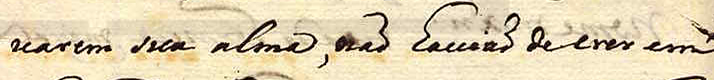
uarem sua alma, naõ hauiaõ de crer em
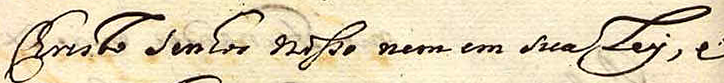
Christo senhor nosso nem em sua Ley, e
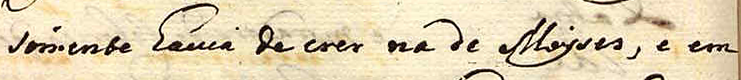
somente hauia de crer na de Moyses, e em
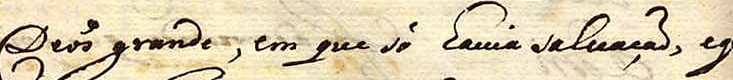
Deos grande, em que só hauia saluaçaõ, e qu_
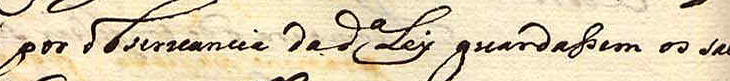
por obseruancia da da Ley guardassem os sab
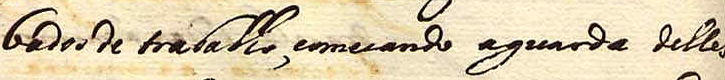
bados de trabalho, comecando a guarda delles
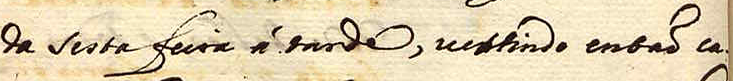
da sesta feira á tarde, uestindo entaõ ca
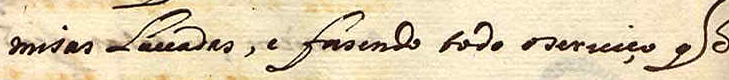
misas Lauadas, e fasendo todo o seruiço q̄
